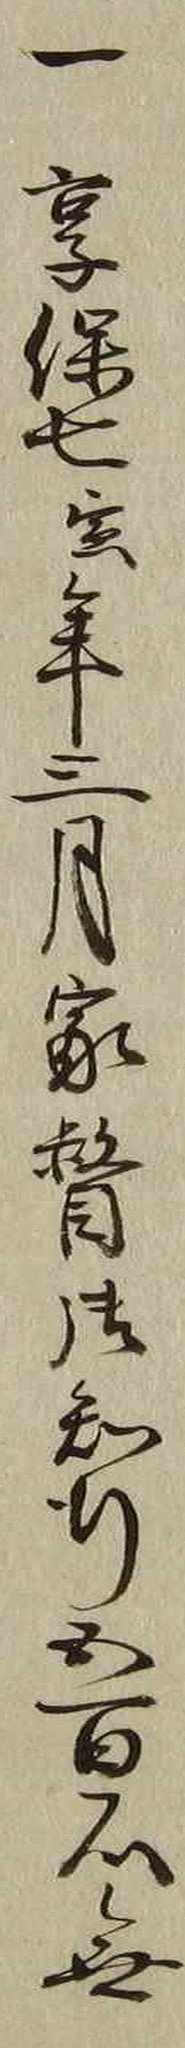一享保七寅年三月家督御知行五百石無
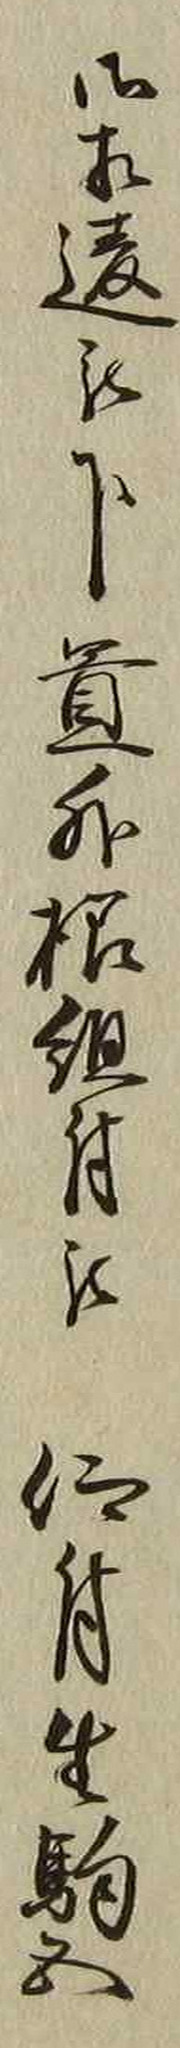御相違被下置外様組付被仰付生駒五
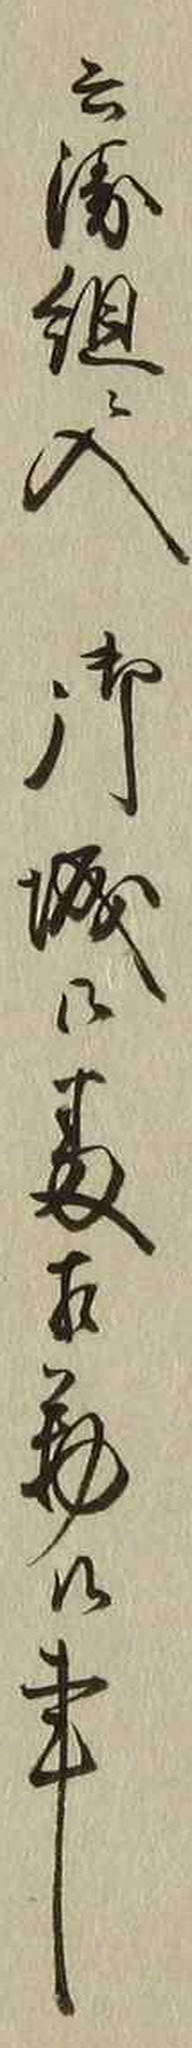兵衛組ニ入御城御番相勤候事
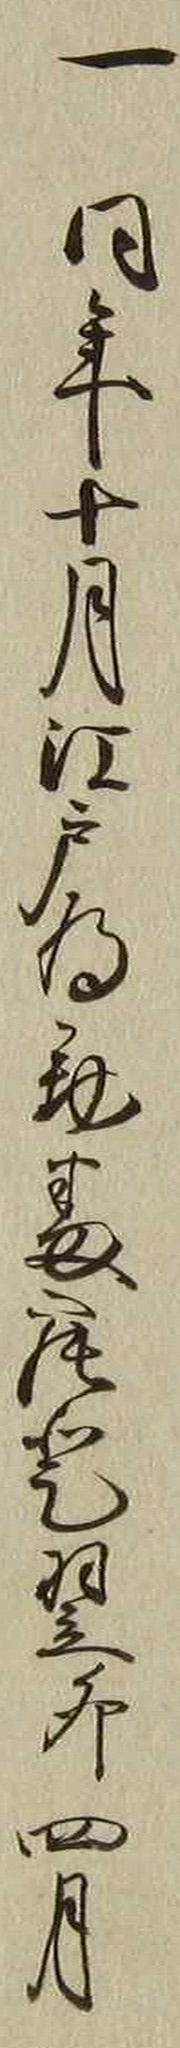一同年十月江戸為勤番罷登翌卯四月
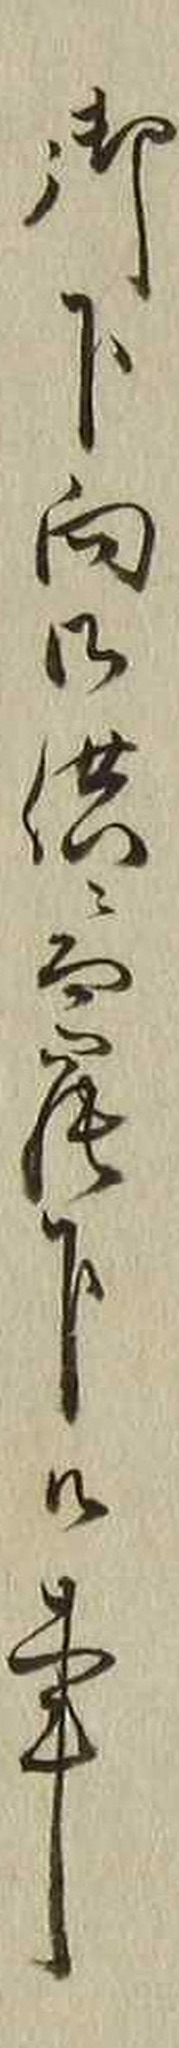御下向御供ニ而罷下候事
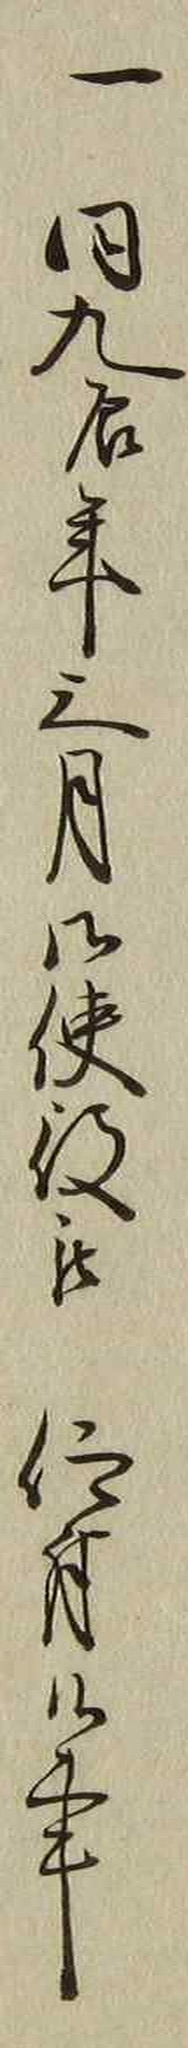一同九辰年三月御使役被仰付候事
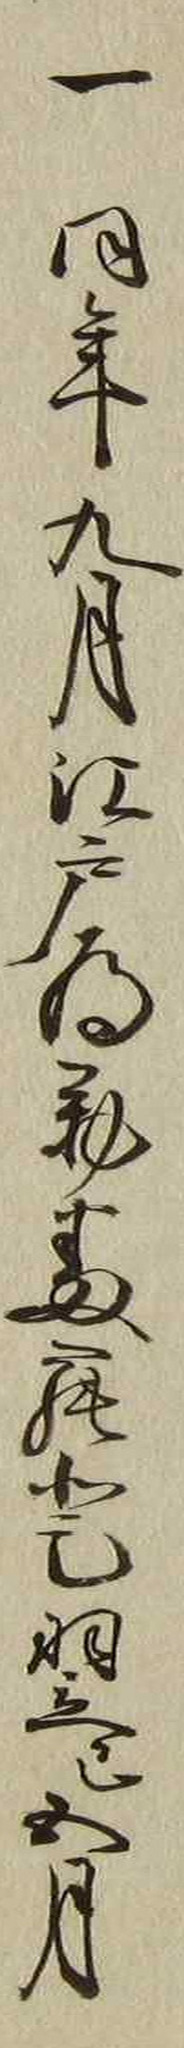一同年九月江戸為勤番罷登翌巳五月
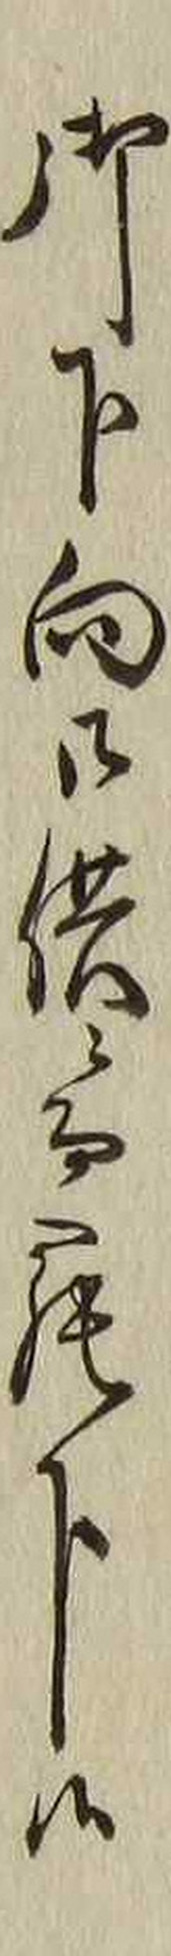御下向御供ニ而罷下候
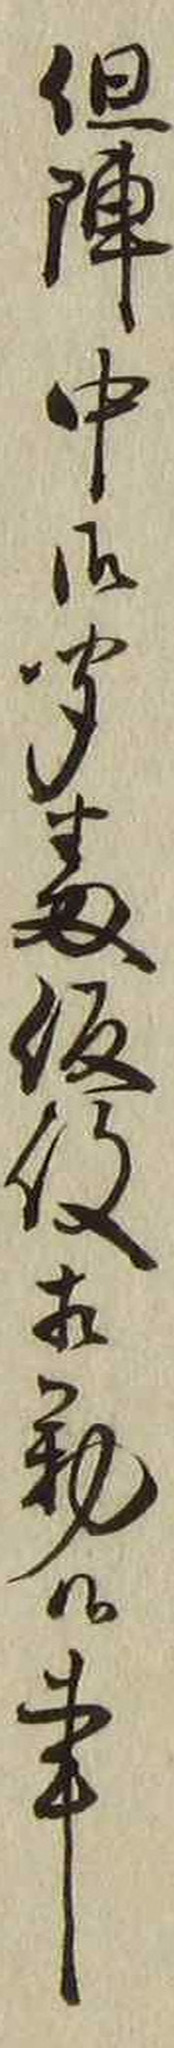但陣中御聞番仮役相勤候事
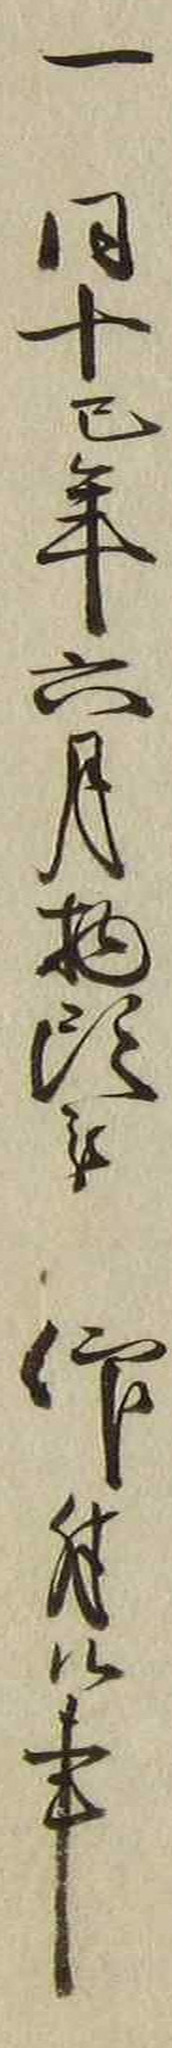一同十巳年六月物頭被仰付候事
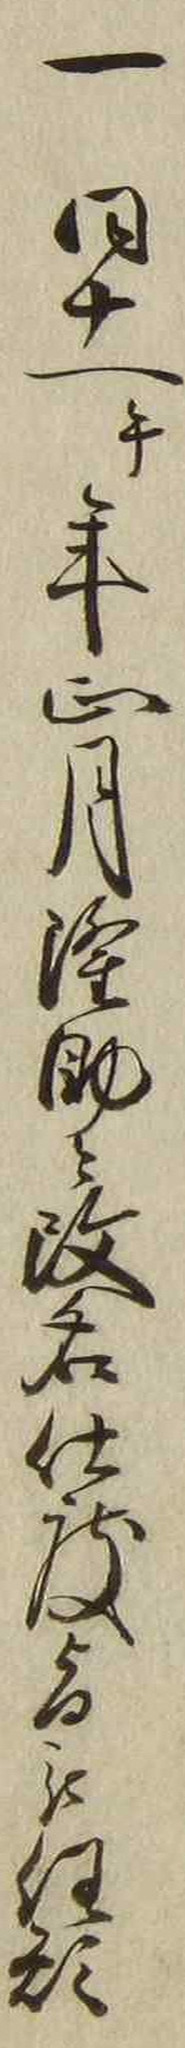一同十一午年正月隆助と改名仕度旨被伺願

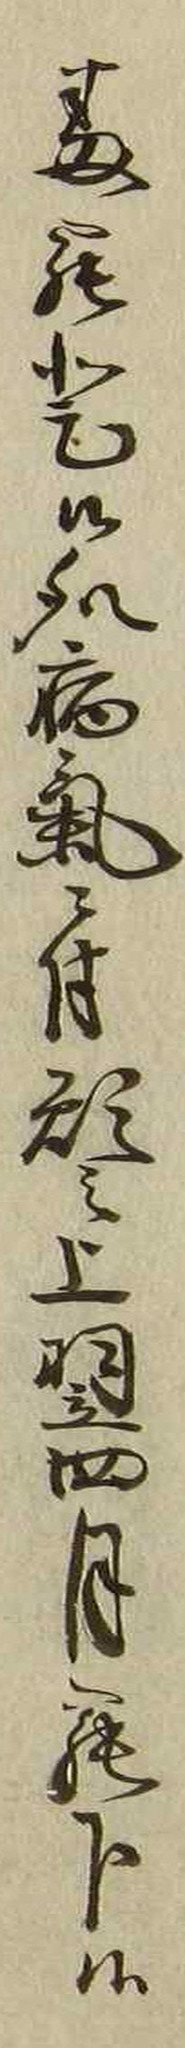番罷登候処病気ニ付願之上翌四月罷下候
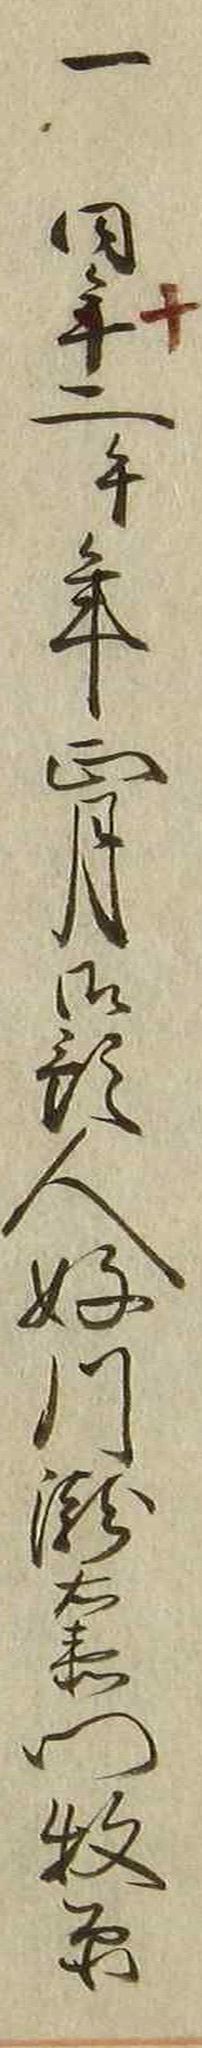一同年二午年正月御預人好門瀧右衛門牧原
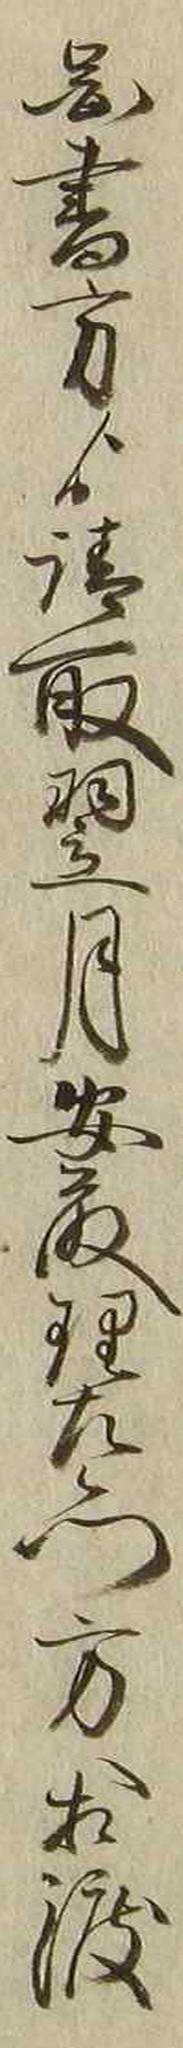図書方ゟ請取翌月安藤理右ヱ門方ヘ相渡
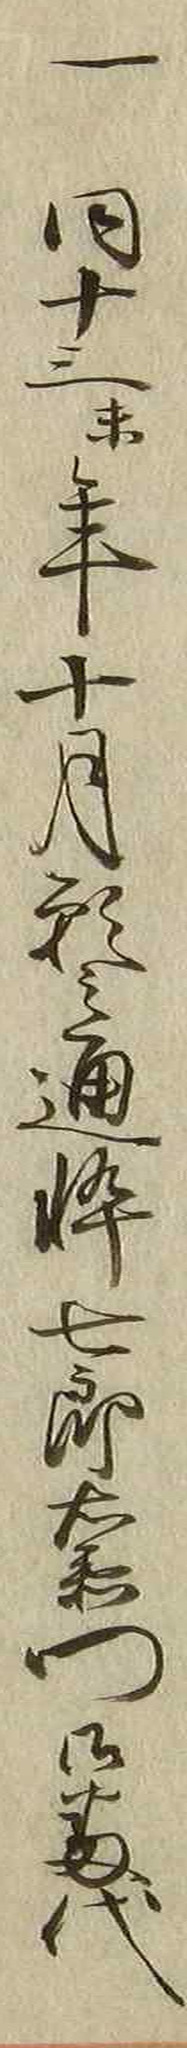一同十三未年十月願之通忰七郎右衛門御番代
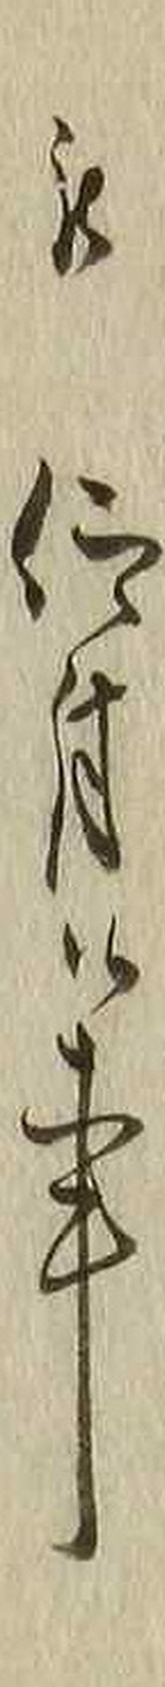被仰付候事
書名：諸士系譜　巻之65　ち之部1
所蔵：会津若松市立会津図書館
